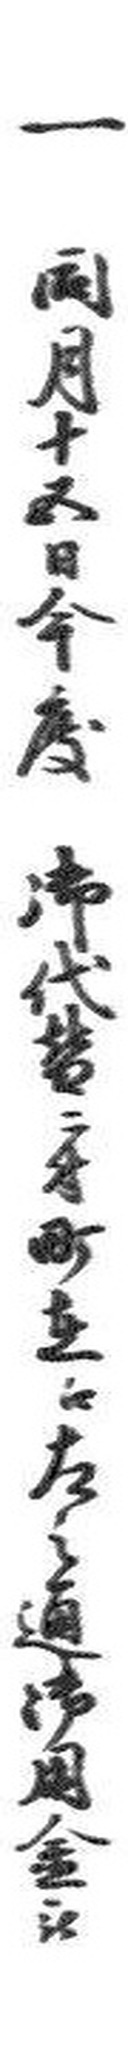一同月十五日今度御代替ニ付町在江左之通御用金被
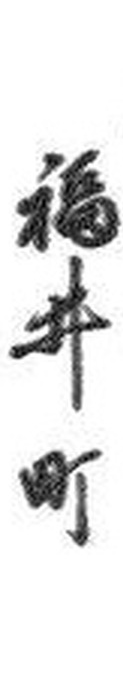福井町

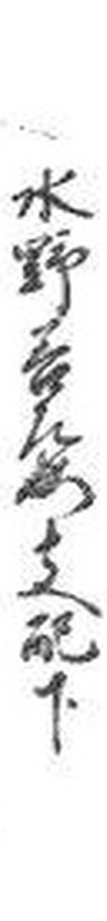水野善左衛門支配下
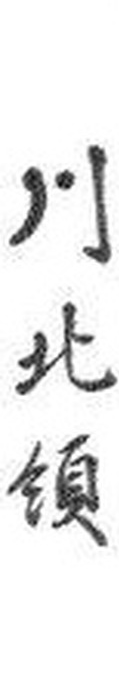川北領
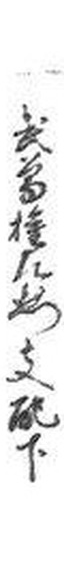武曾権左衛門支配下
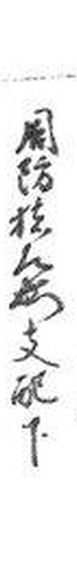周防猪左衛門支配下
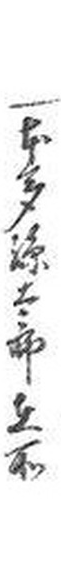本多孫太郎在所
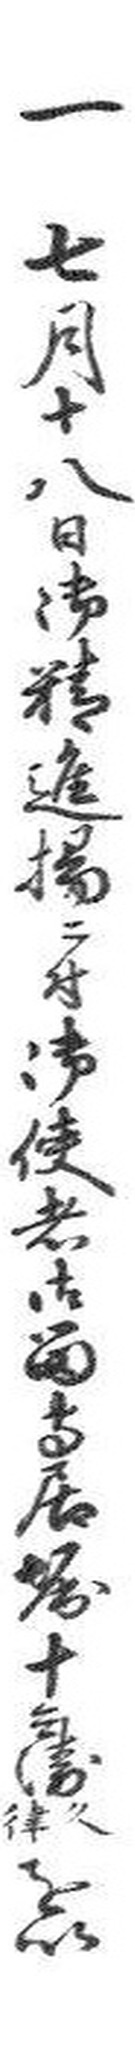一七月十八日御精進揚ニ付御使者御留守居堀十兵衛久律を以
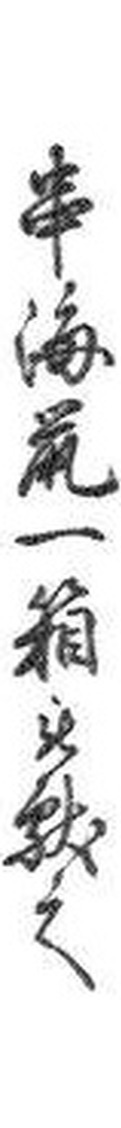串海鼠一箱被献之
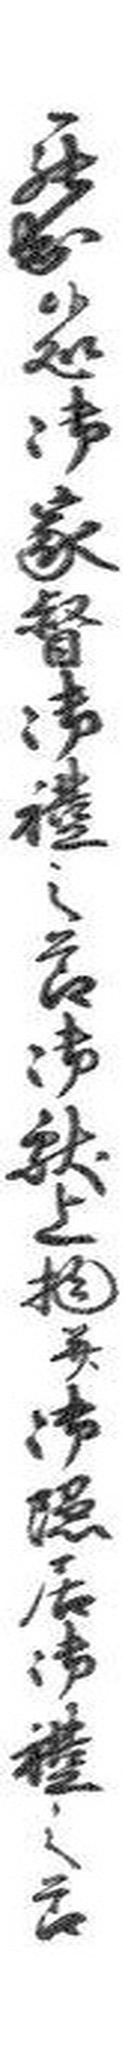罷出候処御家督御礼之節御献上物并御隠居御礼之節
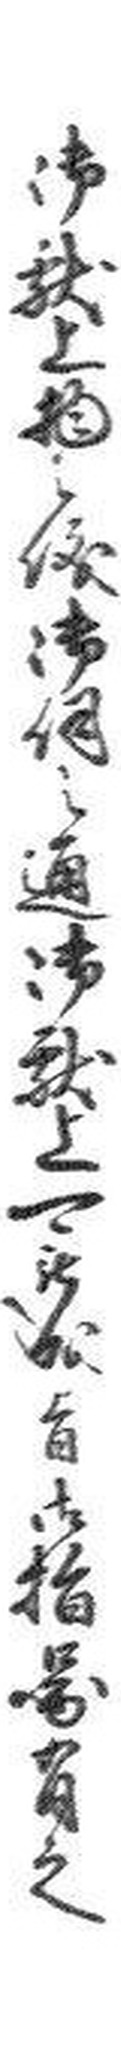御献上物之儀御伺之通御献上可被成旨御指図有之
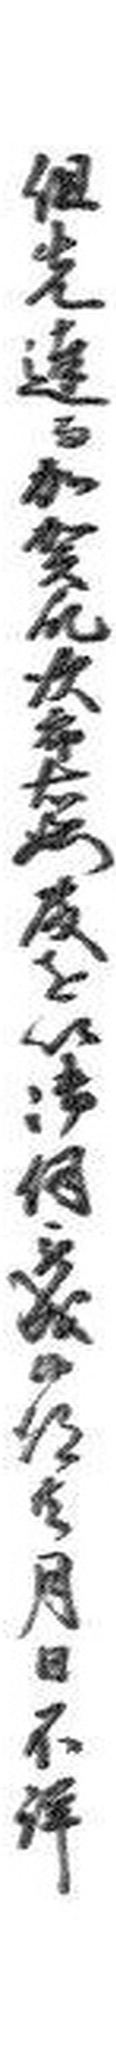但先達而加賀爪次郎右衛門殿を以御伺被成候得共月日不詳
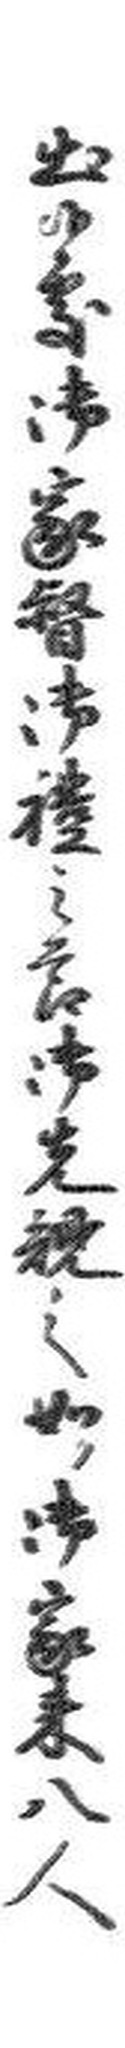出候処御家督御礼之節御先規之如ク御家来八人
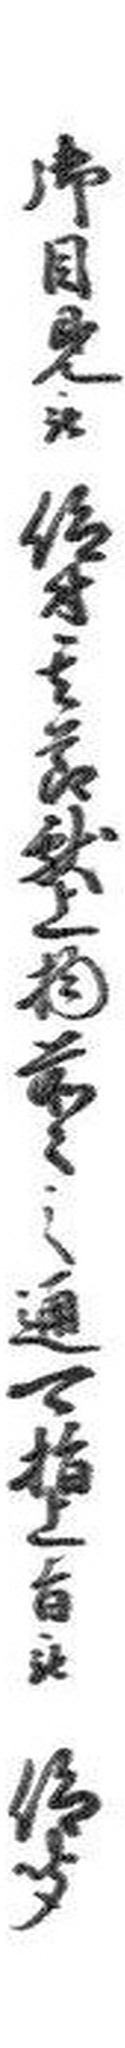御目見被仰付其節献上物前々之通可指上旨被仰聞
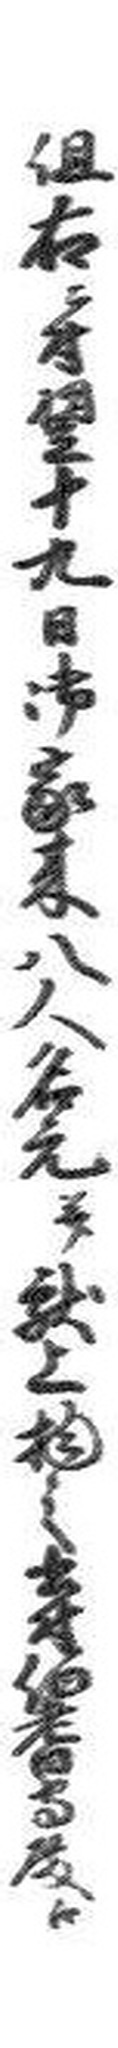但右ニ付翌十九日御家来八人名元并献上物之書付伯耆守殿江
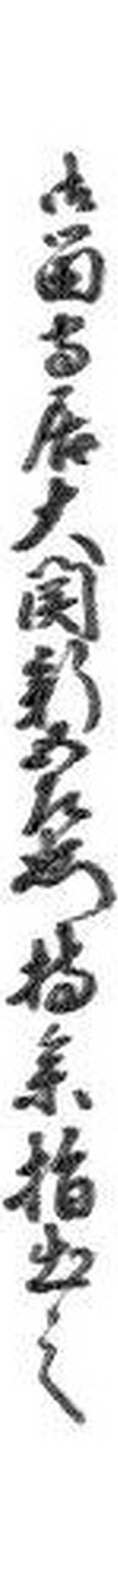御留守居大関新五左衛門持参指出之
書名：家譜 二十八 吉邦公 従宝永七年七月五日到正徳元年十二月
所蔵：福井県文書館 Fukui Prefectural Archives
